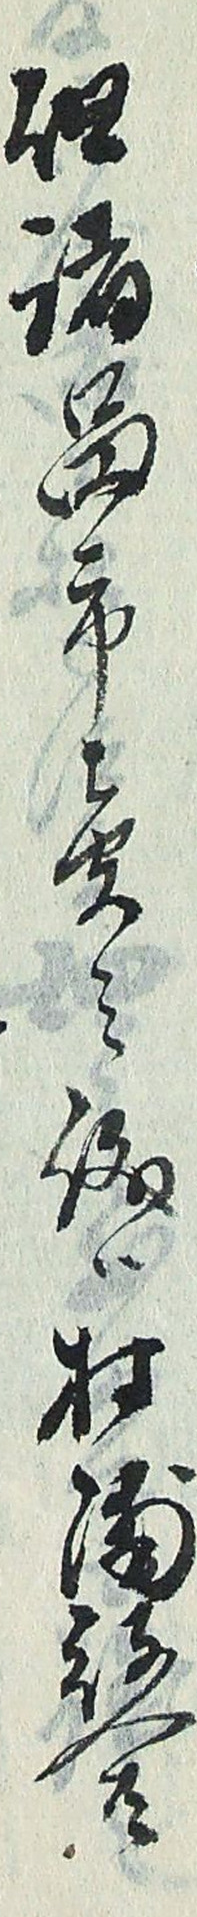但諸品市賣之儀ハ村浦役人共
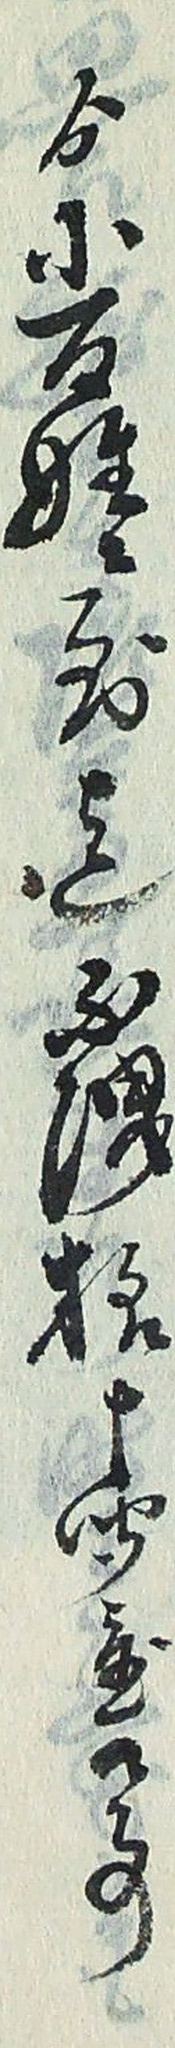ゟ小百姓ニ到迄不洩様申聞置候事
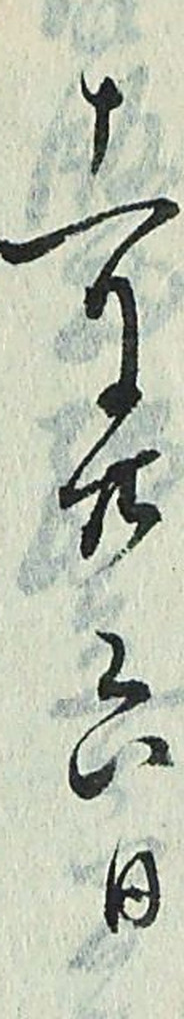十一月廿六日
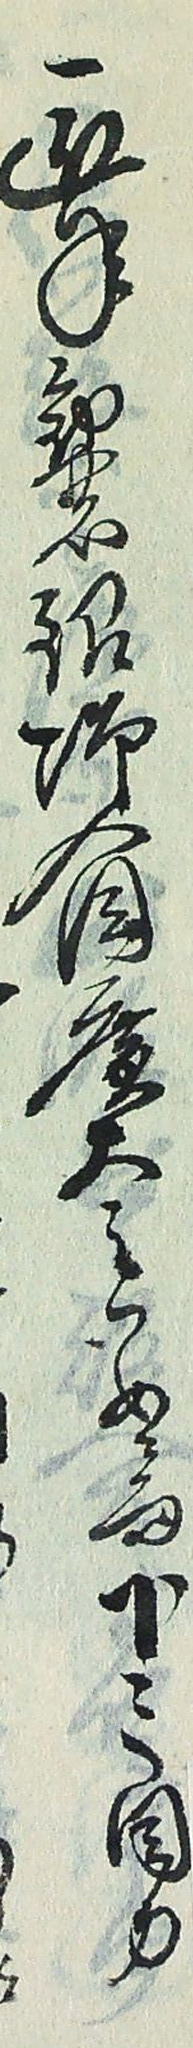一近年勧農銀御入目廣大之御義ニ而下々へ自力
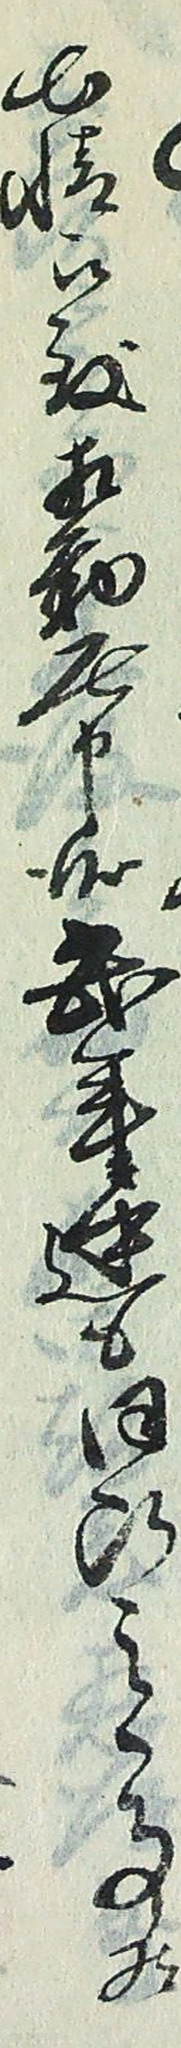出精被致相勤居申所當年迚も同断之御事候
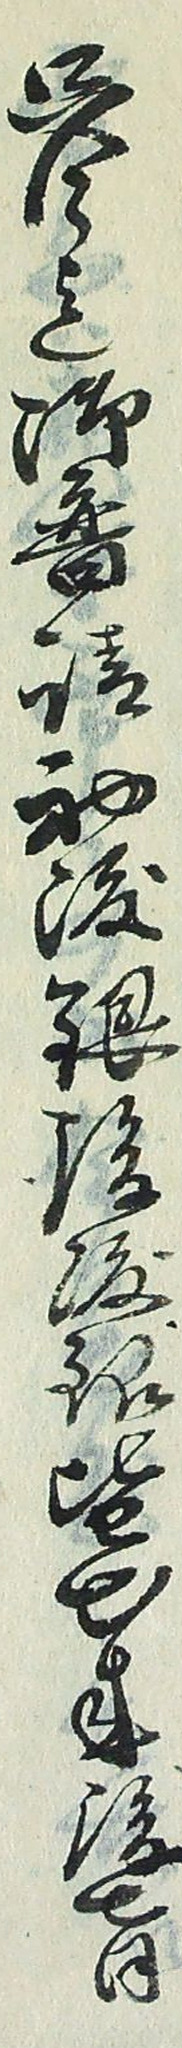只今迄御普請初渡銀後渡銀皆出来後七月
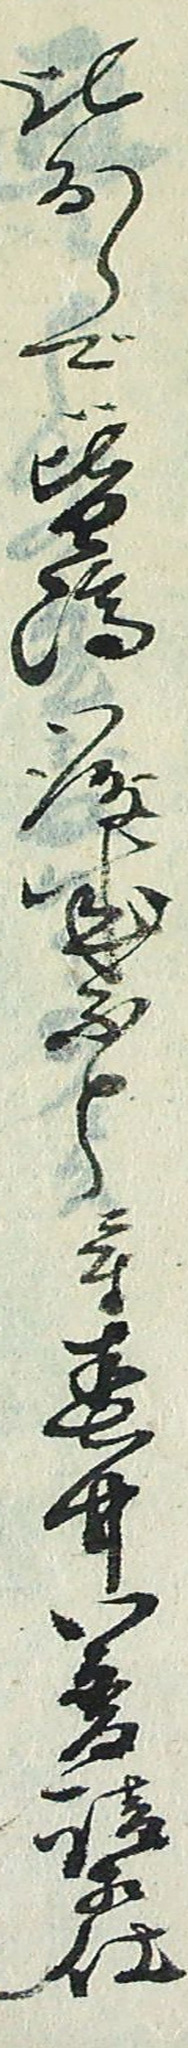比ならでハ皆済御渡成不申ニ付春中御普請相仕
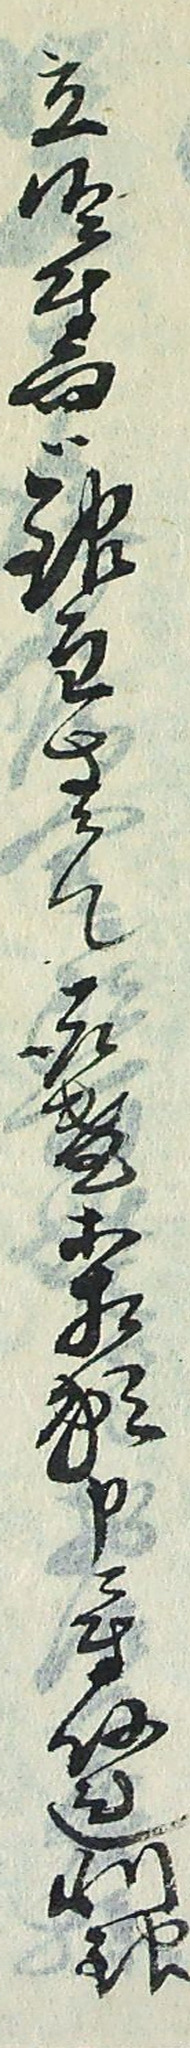立候ニ付而ハ銀主方ニて取替等相頼申ニ付何れ利銀
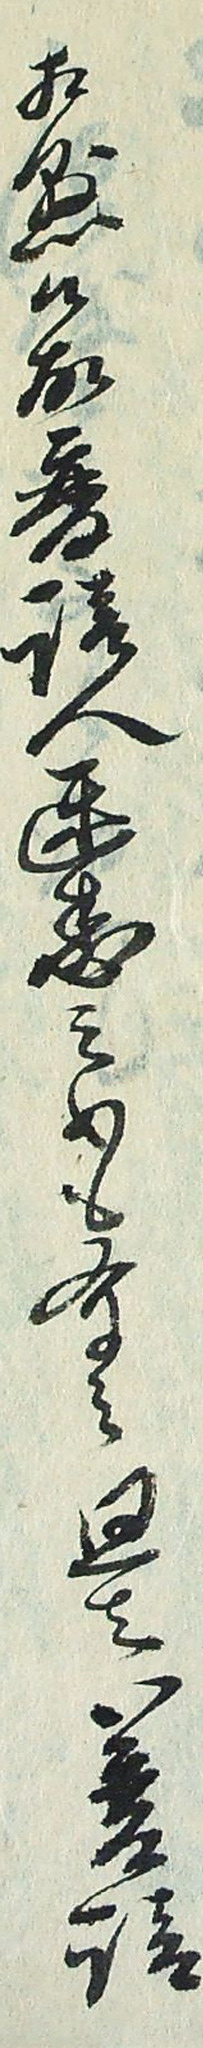相懸候故普請人迷惑之義も有之且者御普請
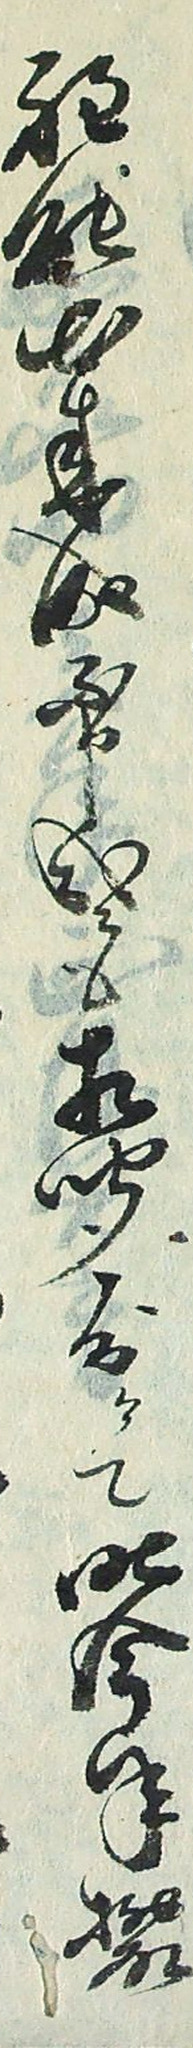程能出来成不申哉ニも相聞分ケて昨今年柄故
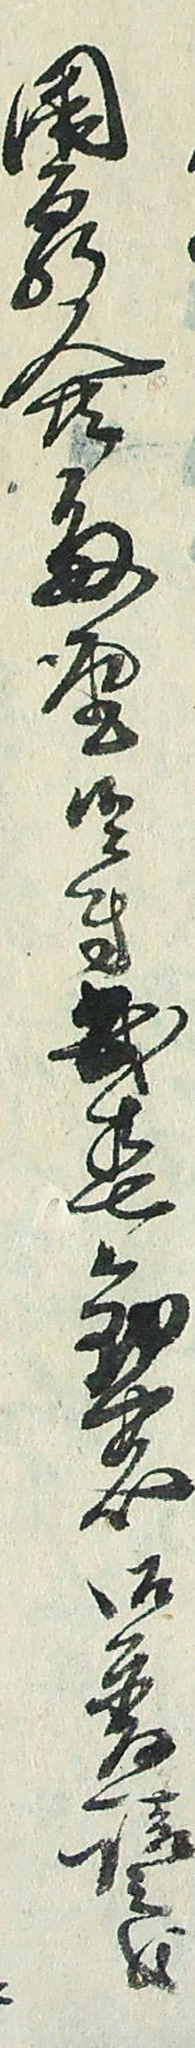困窮人共多御坐候ニ付當廿七勧農御普請之義
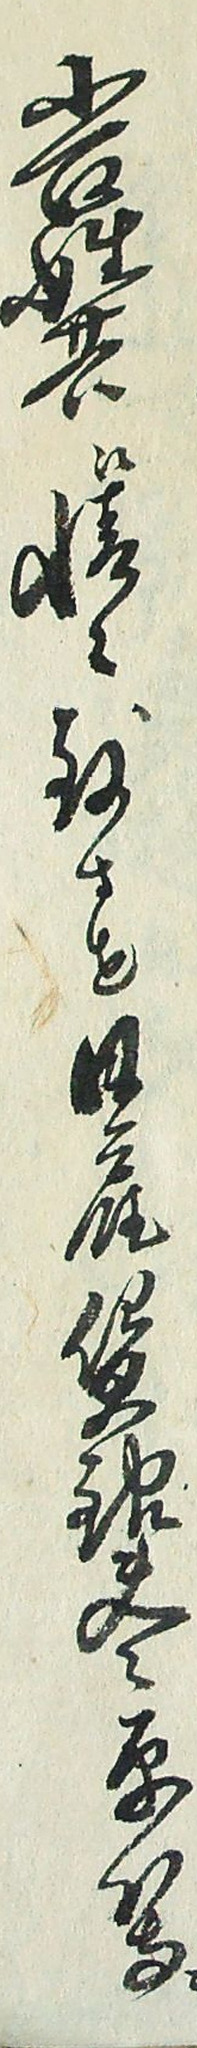小百姓共江精々致させ日雇賃銀夫々平等ニ

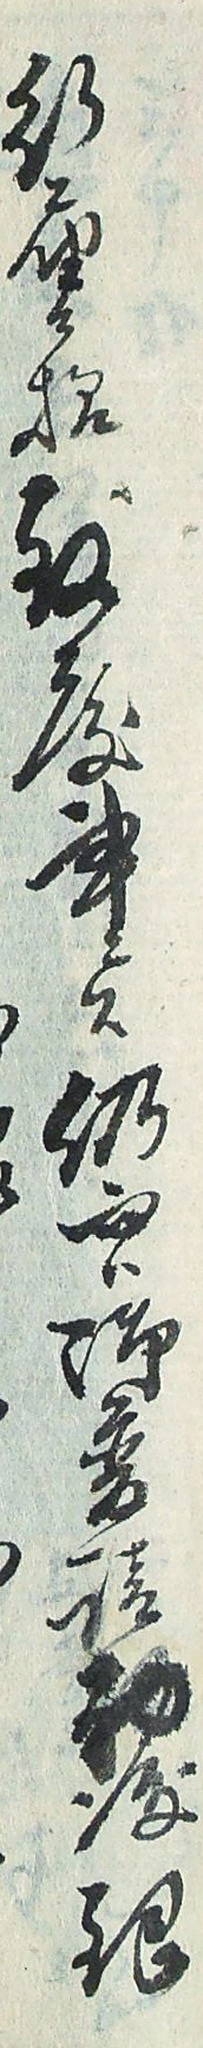行届候様致度事ニ候仍而ハ御普請初渡銀
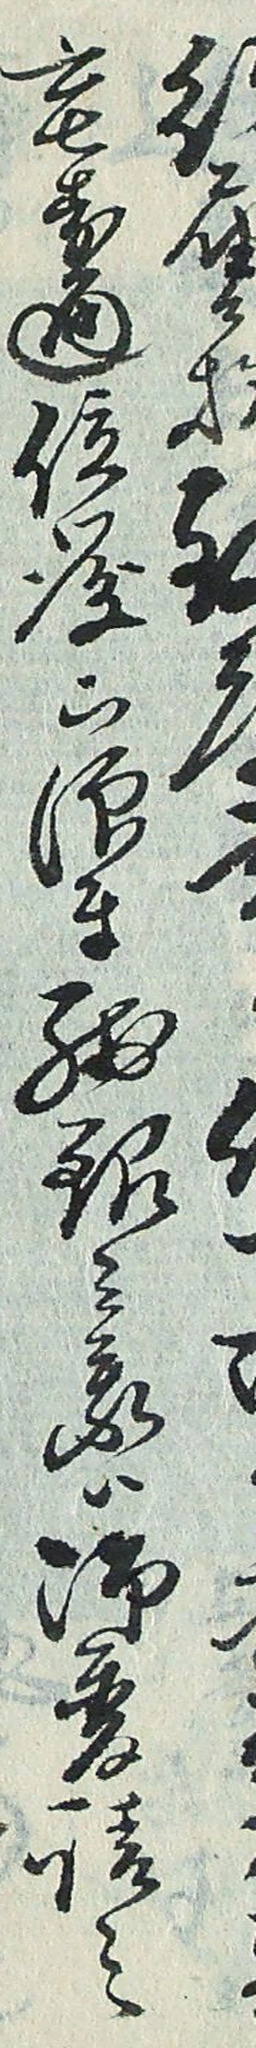六七歩通位御渡被仰付残銀之義ハ御普請之
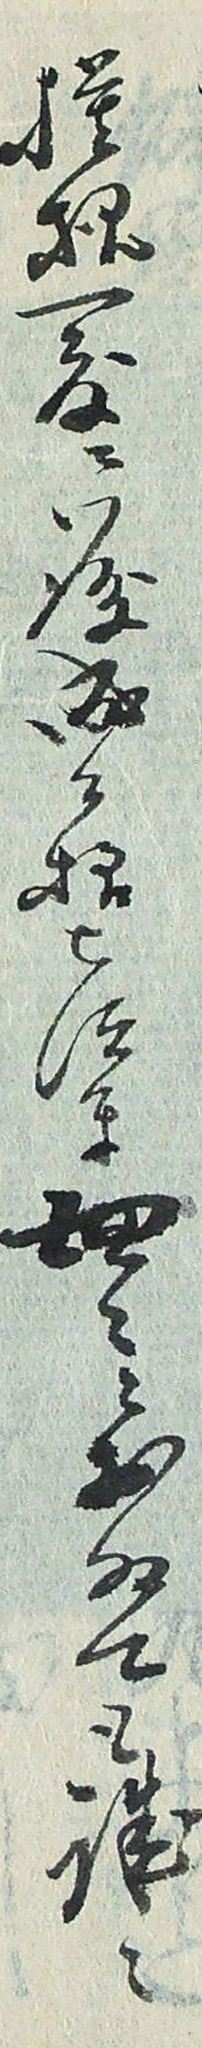模様一度ニ御渡成候様被仰付面々ニおゐても誠ニ
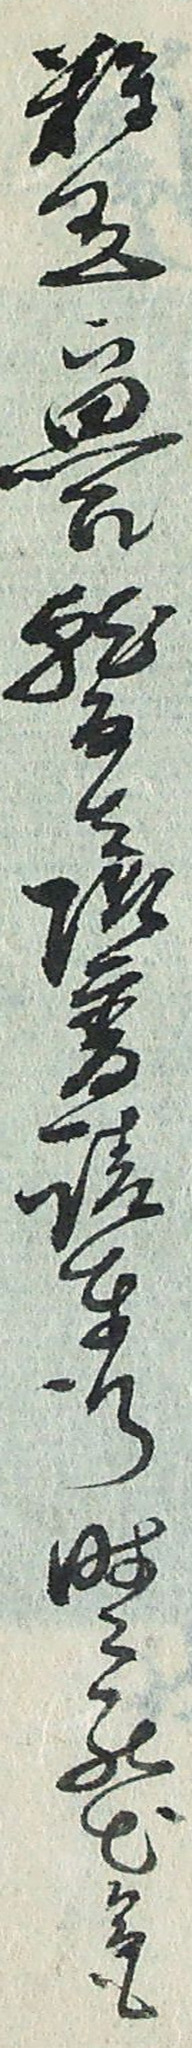難有被思召就而者御普請奉行時々罷出候而も
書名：諸御趣意書并御下知向之写
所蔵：鳴門教育大学 Naruto University of Education
